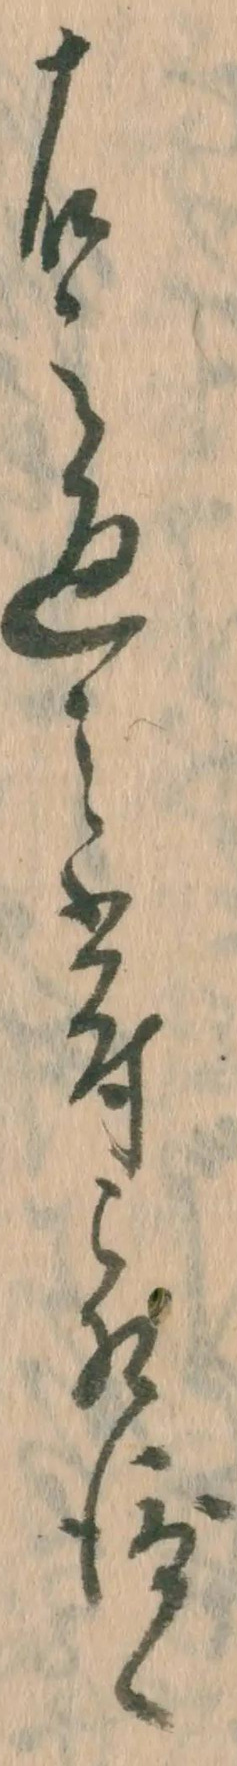右之通之書付被相渡候
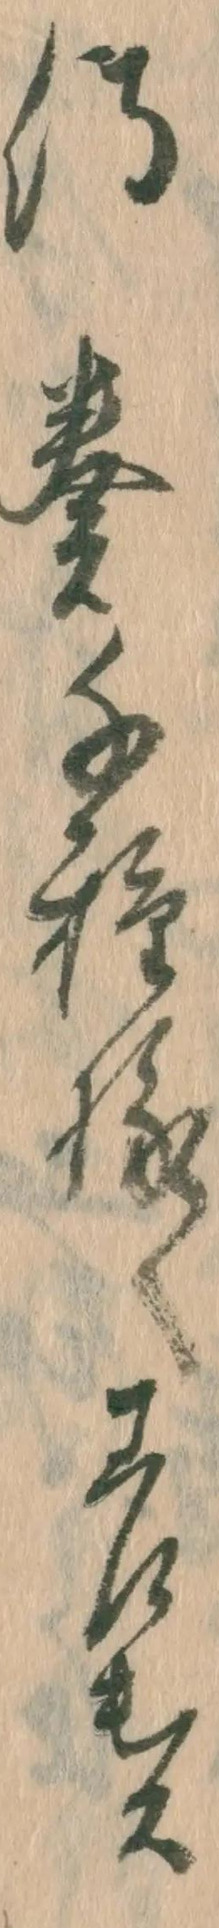伝奏千種様へ差出ス
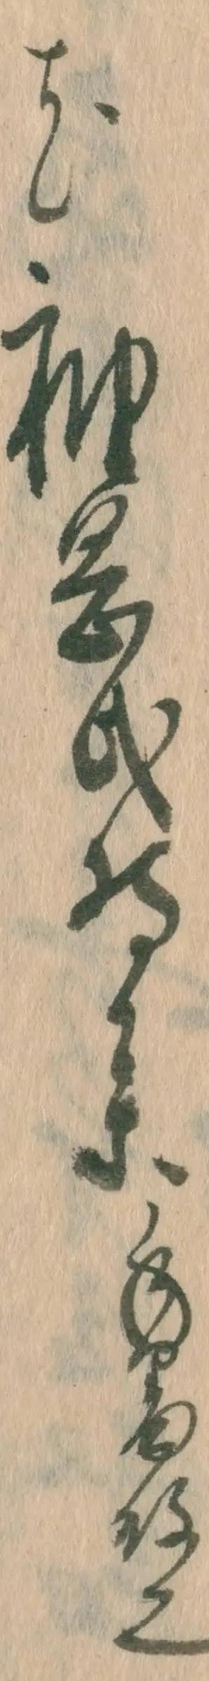尤神岡氏持参年番役也
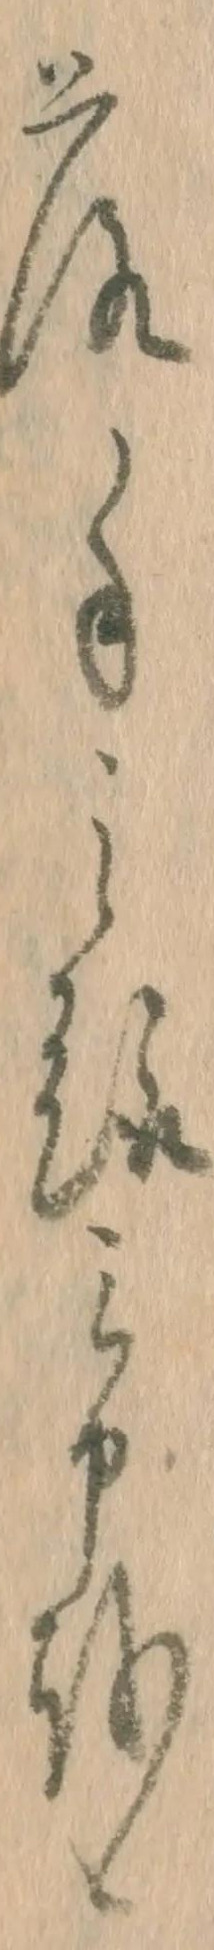落手之趣被申越候

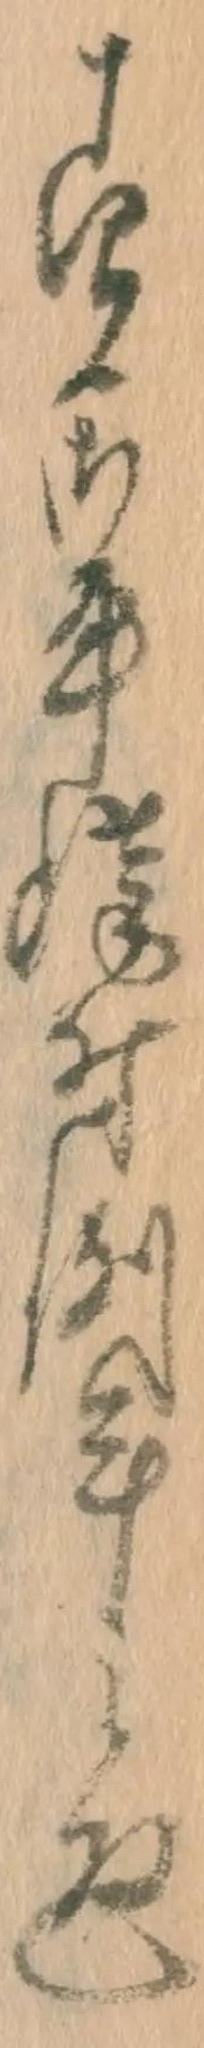十四日御車餝付例年之通
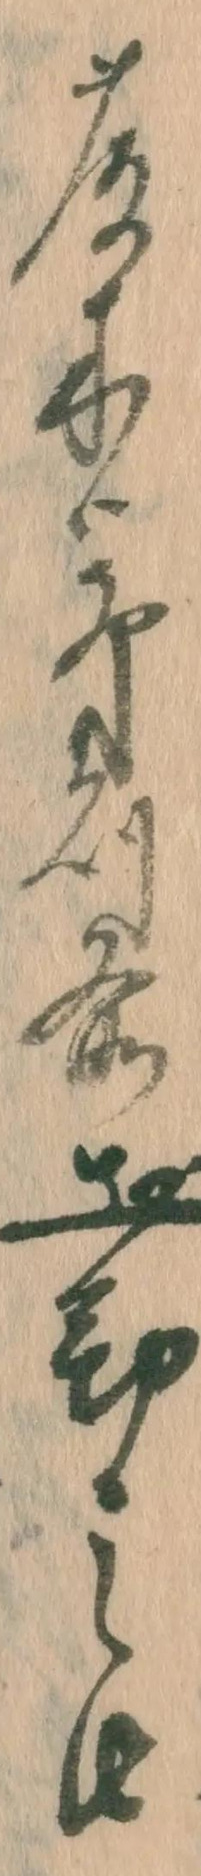藤木ハ卯刻前出勤之由
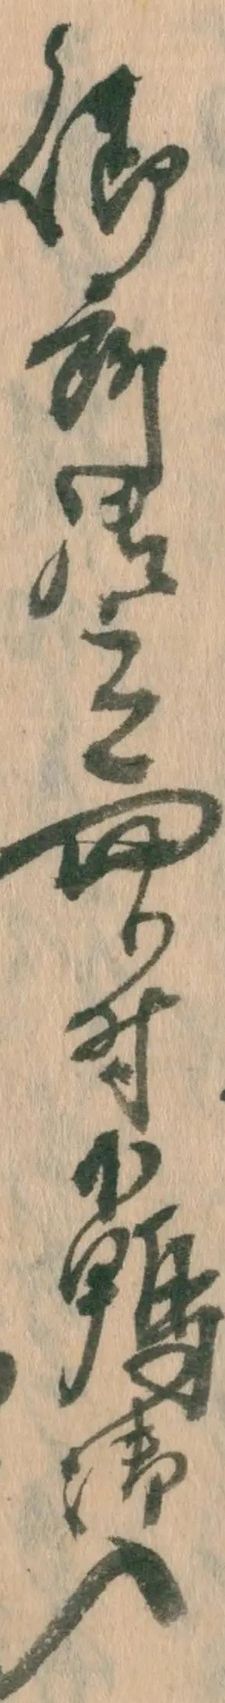御所御立四ツ時下鴨御入
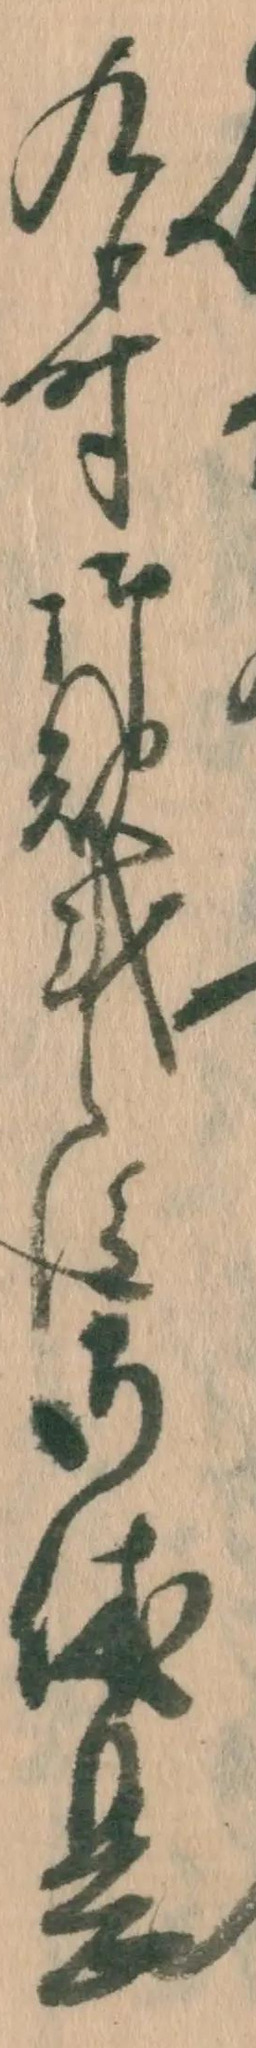九ツ時御規式之後御休息
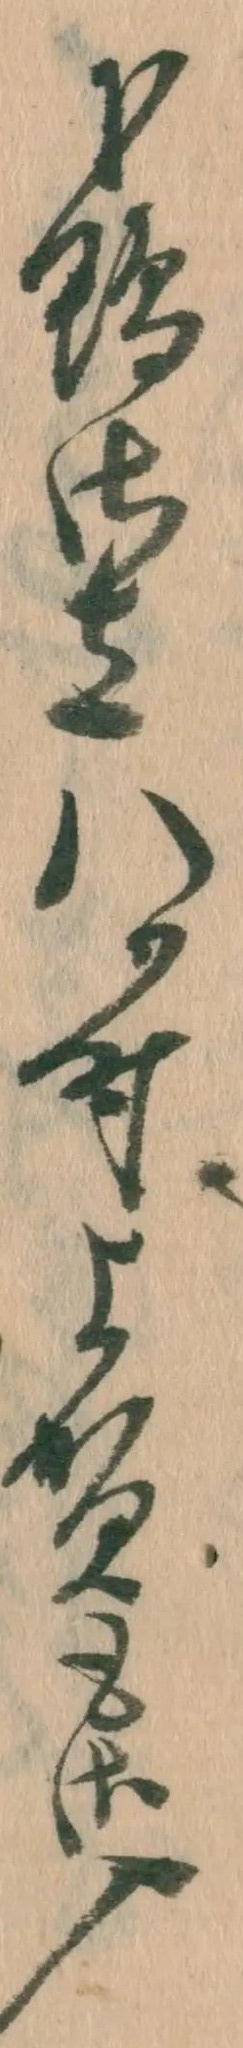下鴨御立八ツ時上賀も御入
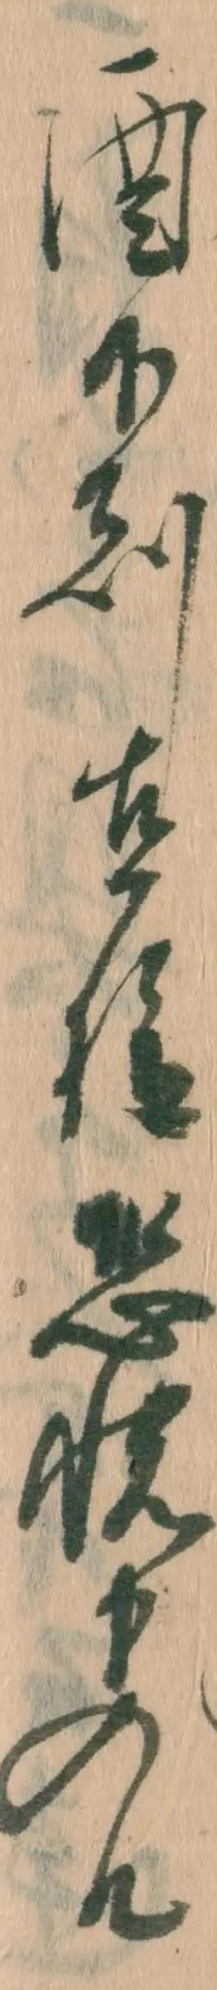酉下刻直様恐悦申入ル
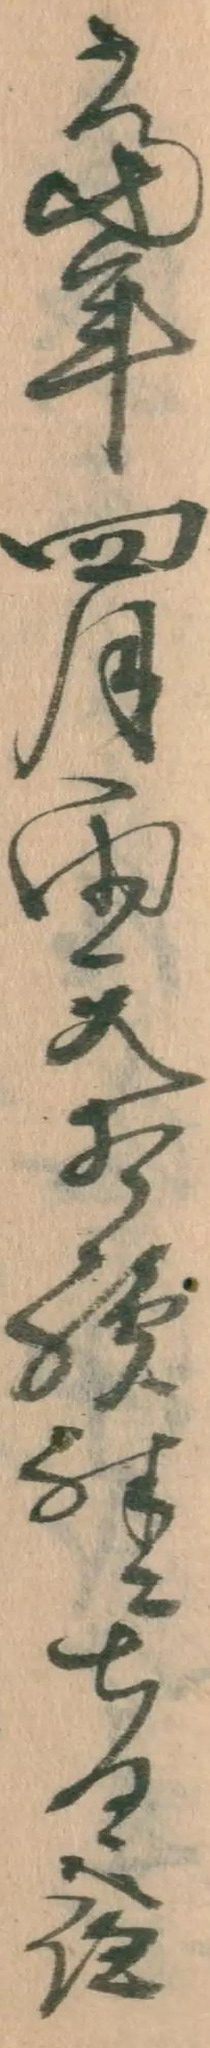当年四月雨天相続殊ニ七日之夜
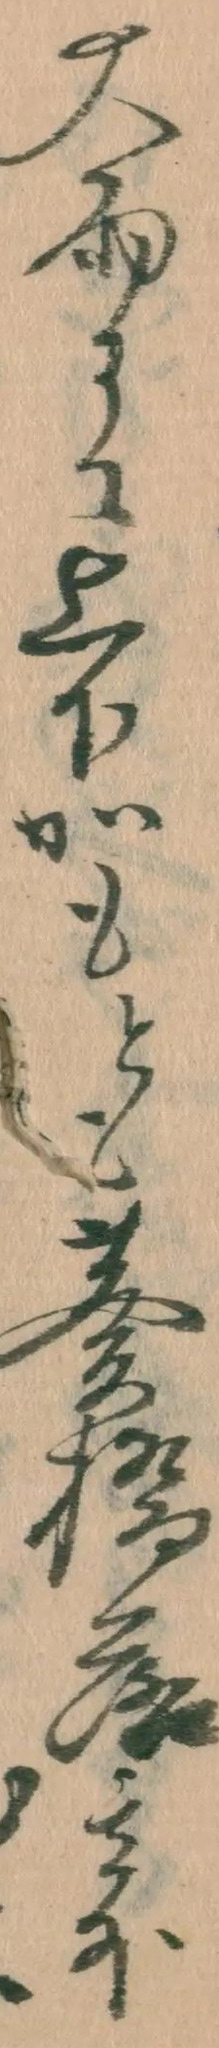大雨にて上下かもとも葵橋落其外
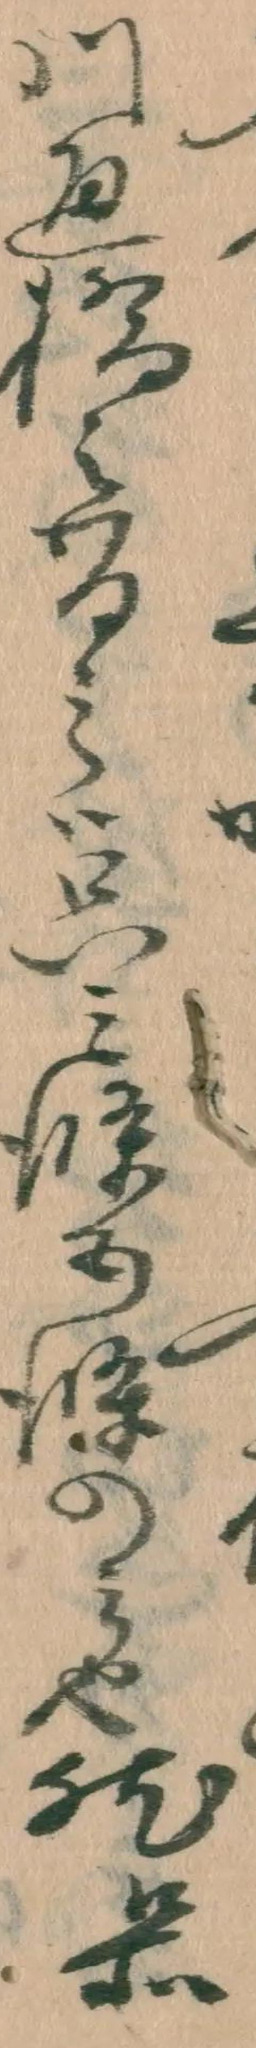川通橋之有之ハ只三條五條のミ也然ル所
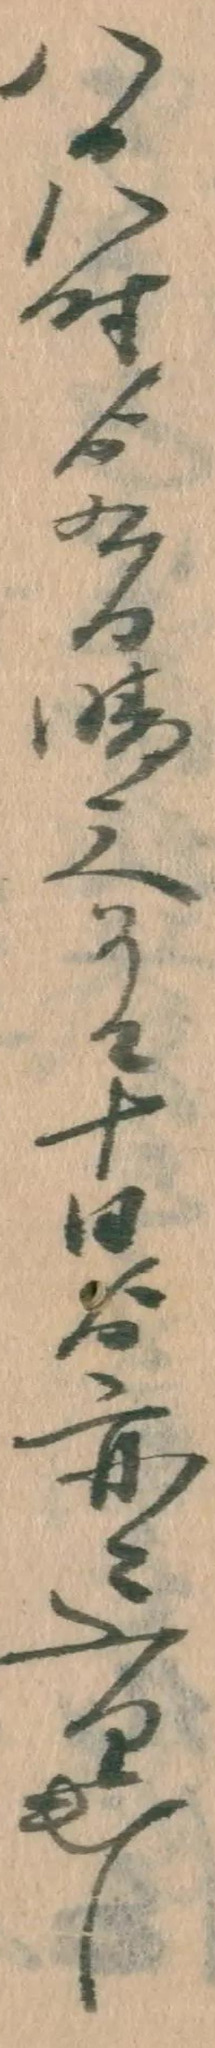八日八時ゟ九日晴天にて十日ゟ亦々ふり出し
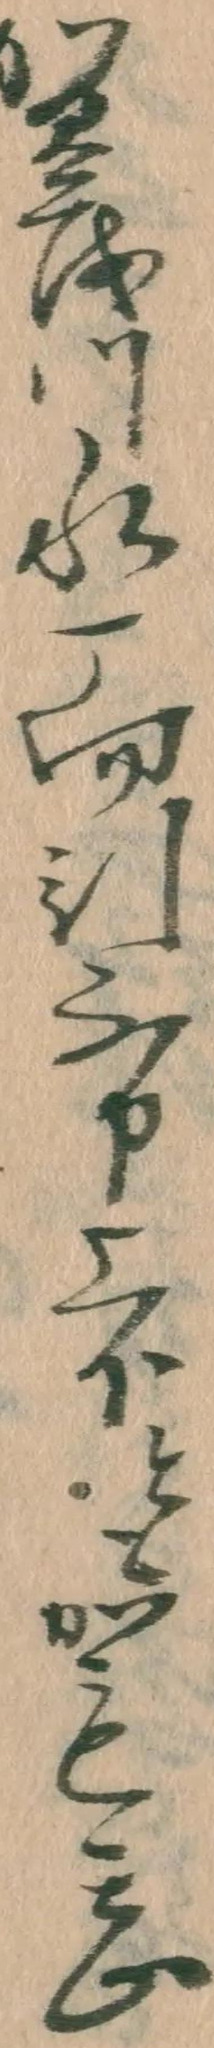賀茂川水一向引不申上下ともかも甚
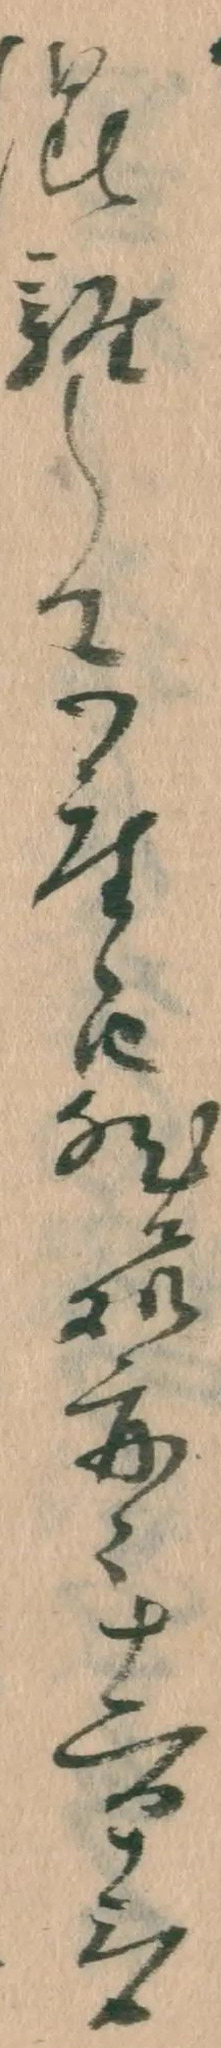混雑して御座候由然ル処亦々十二日十三日
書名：賀茂社記録. 第61冊
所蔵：国立国会図書館 National Diet Library, JAPAN
